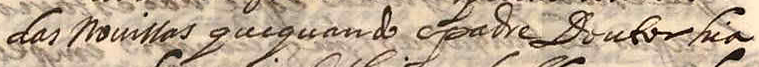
das nouissas que quando o padre Doutor hia
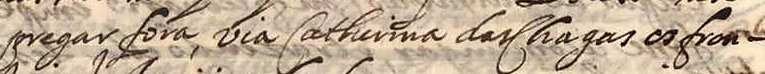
pregar fora, via Catherina das Chagas os fron
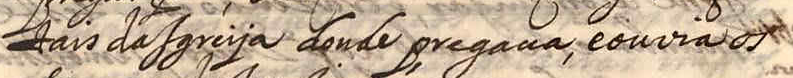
tais da Jgreija donde pregaua, e ouvia os
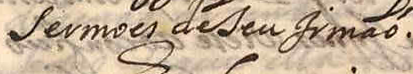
sermoes de seu Jrmaõ.
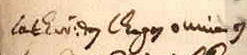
Cather.a das Chagas ouuia os
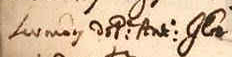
Sermões do P.e Ant.o Glz̄
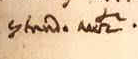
estando auz.te
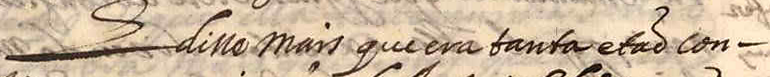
E disse mais que era tanta, e taõ con
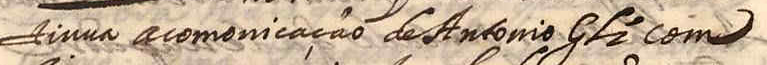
tinua a comonicaçaõ de Antonio Glz̄ com
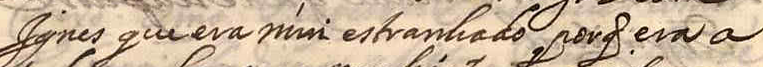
Jgnes que era mui estranhado porq̄ era a
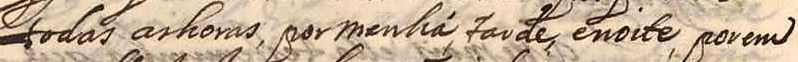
todas as horas, por menhā, tarde, e noite, porem
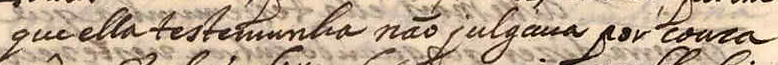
que ella testemunha naõ julgaua por couza
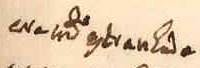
era mto estranhada
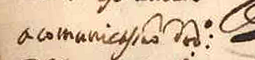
a comunicassão do d.o
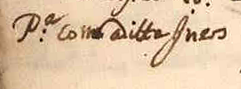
P.e com a ditta Jnes
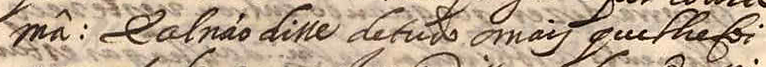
mâ. E al naõ disse de tudo o mais que lhe foi
